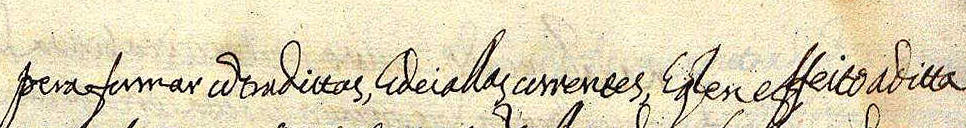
pera formar cōtradittas, E dei allas correntes, E q̄ en effeito a ditta
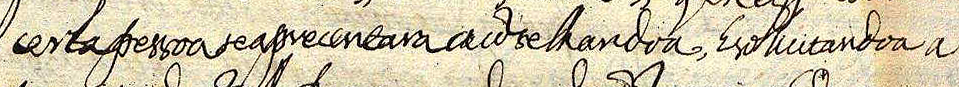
certa pessoa se aprecentara e acōselhandoa, E sollicitandoa a
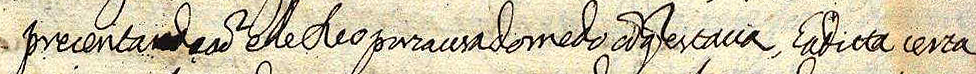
precentando cō elle Reo por causa do medo do q̄ estaua, E a ditta certa
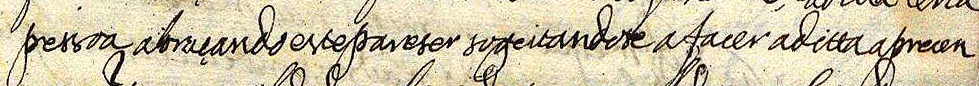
pessoa abraçando este pareser sogeitandose a facer a ditta aprecen
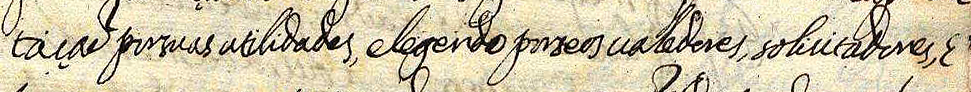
taçaõ por suas utilidades, elegendo por seos ualedores, solicitadores, E
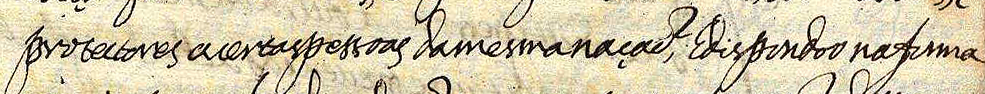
protectores a certas pessoas da mesma naçaõ, E dispondoo na forma
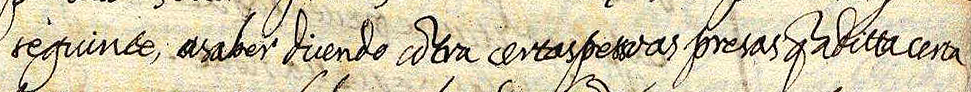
seguinte, a saber dicendo cōtra certas pessoas presas q̄ a ditta certa
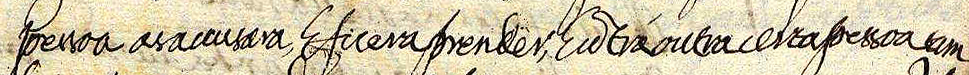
pessoa as accusara, E ficera prender, E cōtra outra certa pessoa tam
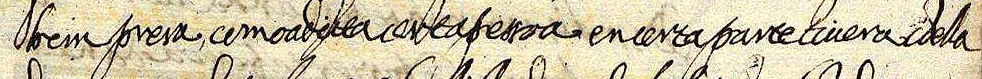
bem presa, como a ditta certa pessoa en certa parte tiuera cō ella
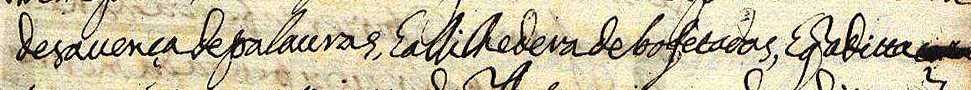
desauença de palauras, E alli lhe dera de bofetadas, E q̄ a ditta certa
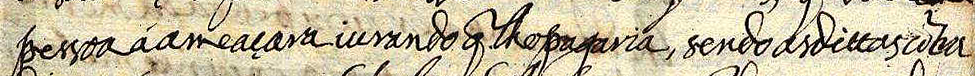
pessoa a ameaçara iurando q̄ lhe pagaria, sendo as dittas cōtra
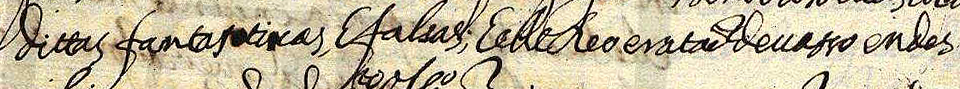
dittas fantas_ti_cas, e falsas; E elle Reo era taõ deuasso en des
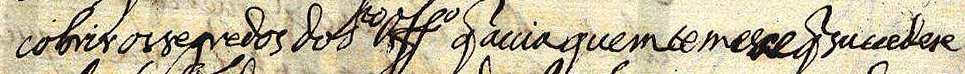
cobrir os segredos do sto Offo q̄ auia quem temesse q̄ succedese
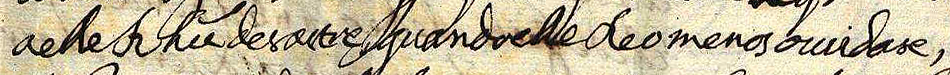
a elle R hū desastre, quando elle Reo menos o cuidase,
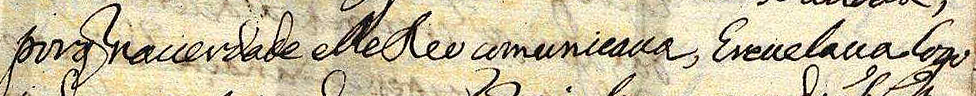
porq̄ na uerdade elle Reo comunicaua, E reuelaua logo
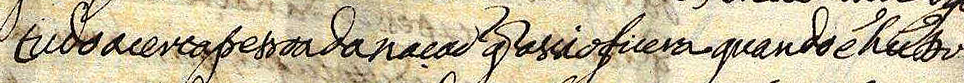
tudo a certa pessoa da naçaõ q̄ assi o ficera quando ē hū Do
